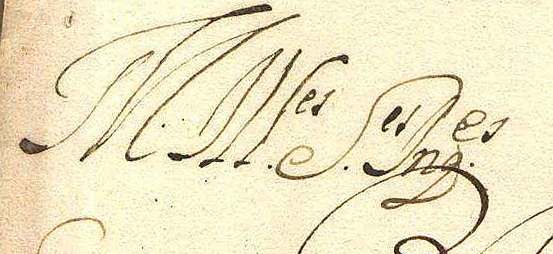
M Ill.es S.es Inq.es
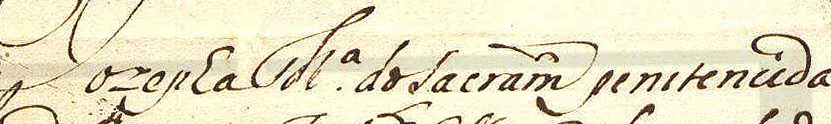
Iozepha M.a do Sacramto penitencida
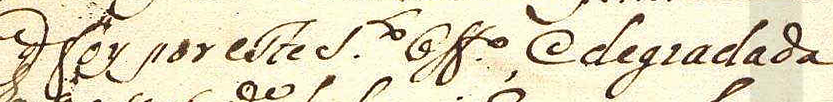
q̄ foy por este s.to Off.o, e degradada
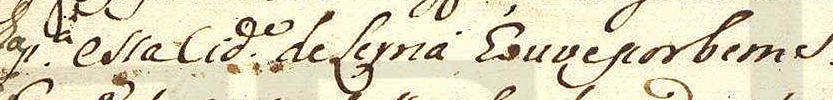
p.a essa Cid.e de Leyria houve por bem s.
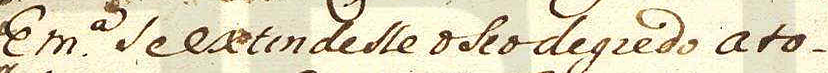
Em.a se extendesse o seo degredo a to
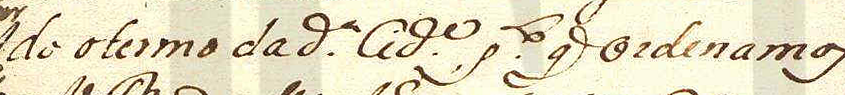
do o termo da d.a Cid.e, p.lo q̄ ordenamos
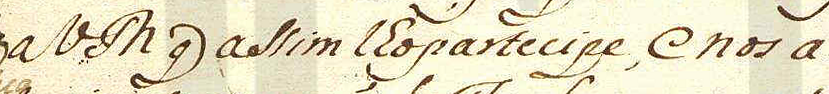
a VM q̄ assim lho partecipe, e nos a
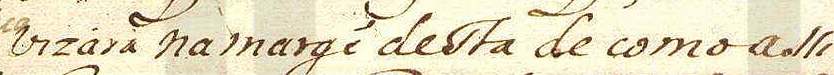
vizara na margē desta de como assī
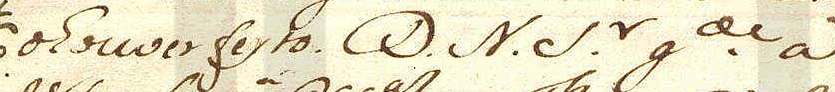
o houver feyto. D. N. s.r g.de a
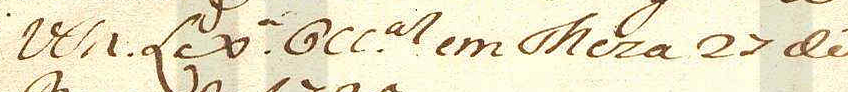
VM. Lix.a Occ.al em Meza 27 de
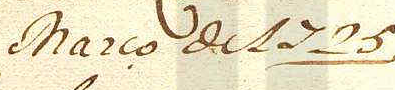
Março de 1725.
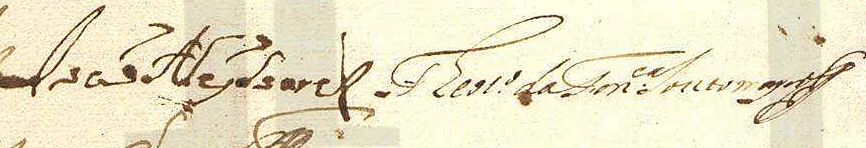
Ioaõ Ales̄ Soares Theot.o da Fon.ca Souto mayor
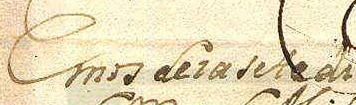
Em os dezasete di
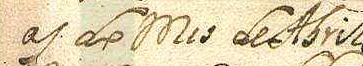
as do Mes de Abril
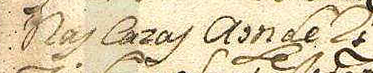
Nas Cazas aonde Ri
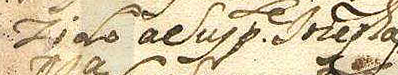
Zido a Supp.te Iozepha
